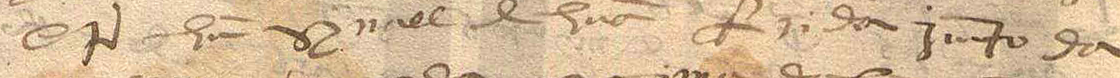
e tē hū synall de huā ferida Jūto da
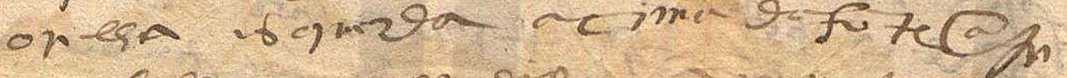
orelha esquerda acima da fōte ātre
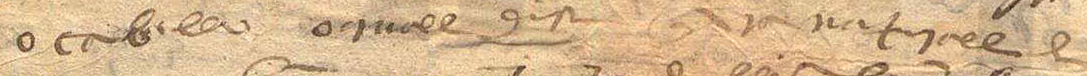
o cabello o quall dise q̄ era naturall de
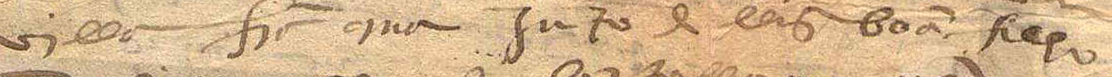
villa frāqua Jūto de llisboā filho
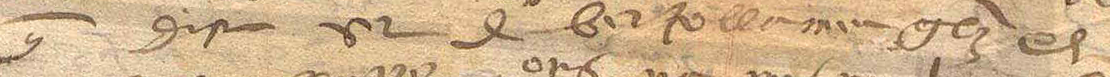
q̄ dise ser de bertollameu glz̄ e de
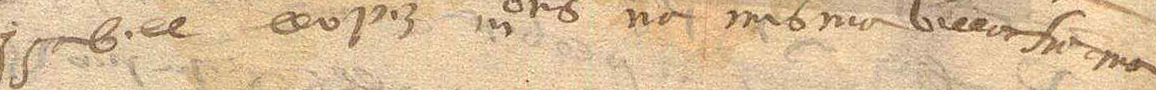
Jsabell llopez mores na mesma villa fraqua
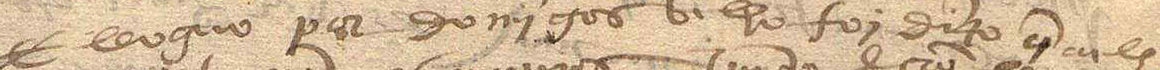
E lloguo por domj̄gos velho foj dīto q̄ a elle
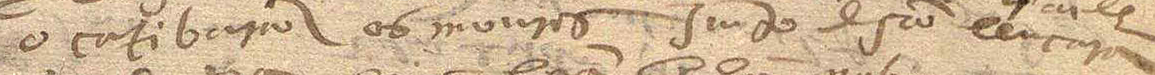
o cativaraõ os mouros Jūto de saõ llucara
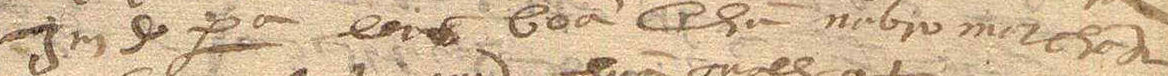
Jmdo ꝑa llisboā ē hū navjo merchāte
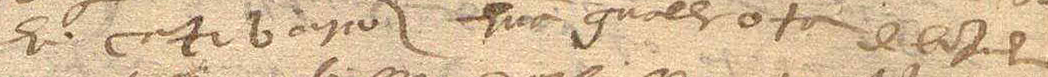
hu cativaraõ huā gualleota de brtanha
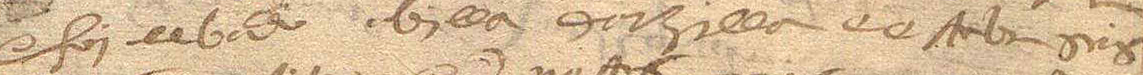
e foj llvado a villa darzilla e esteve seis
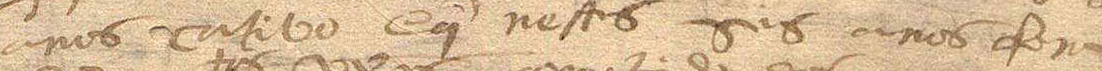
anos cativo e q̄ nestes seis anos fora
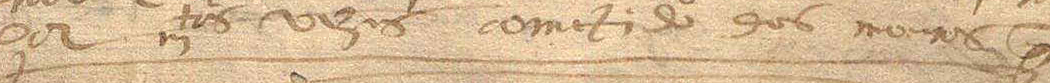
por mtas vezes cometido dos mouros q̄
